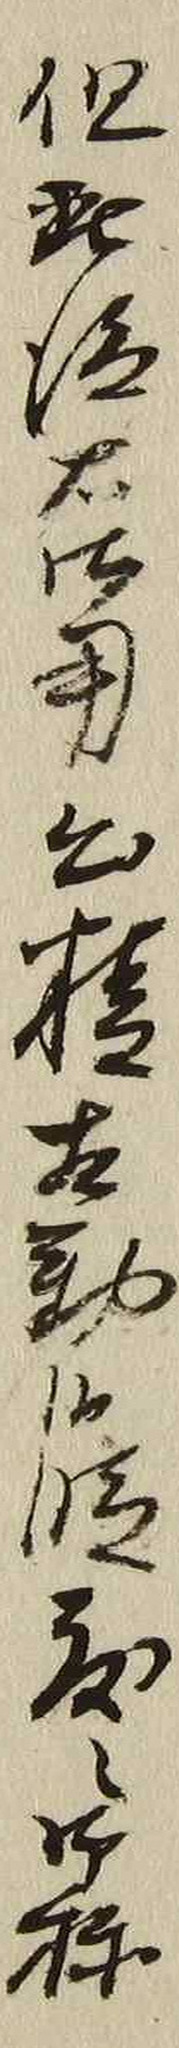但此後右御用出精相勤候段度々御祢
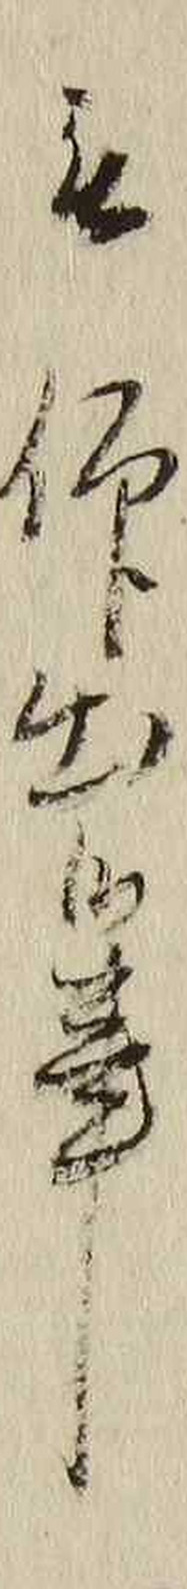被仰出候事
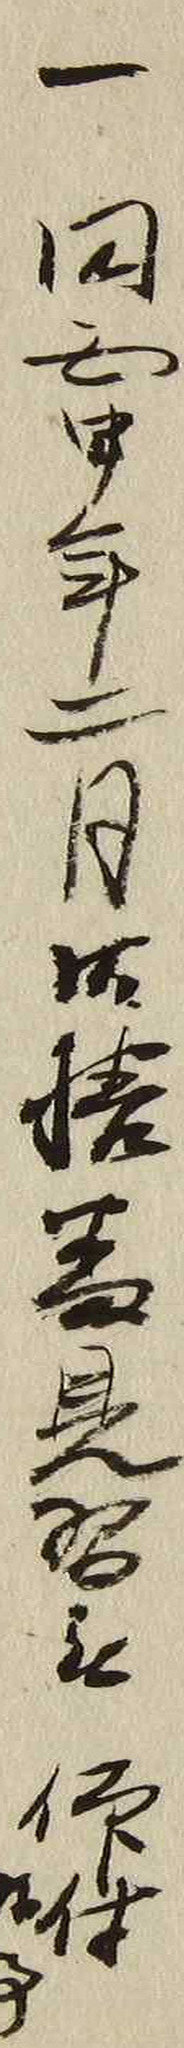一同五申年二月御膳番見習被仰付候事
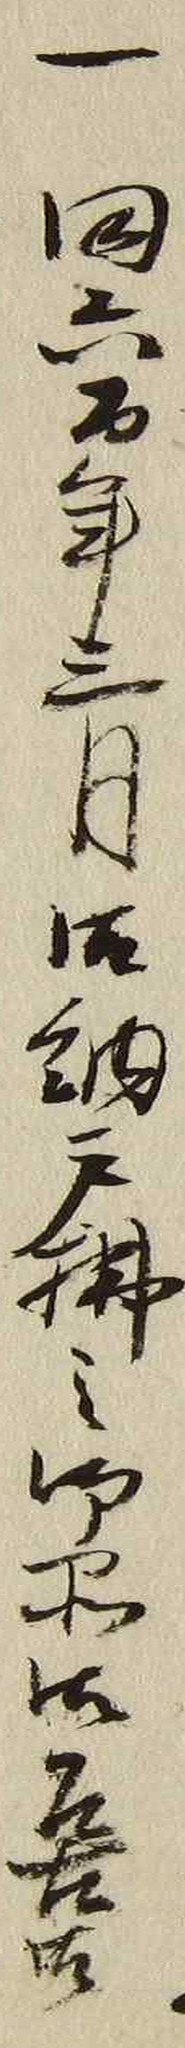一同六酉年三月御納戸払之御品御召古御
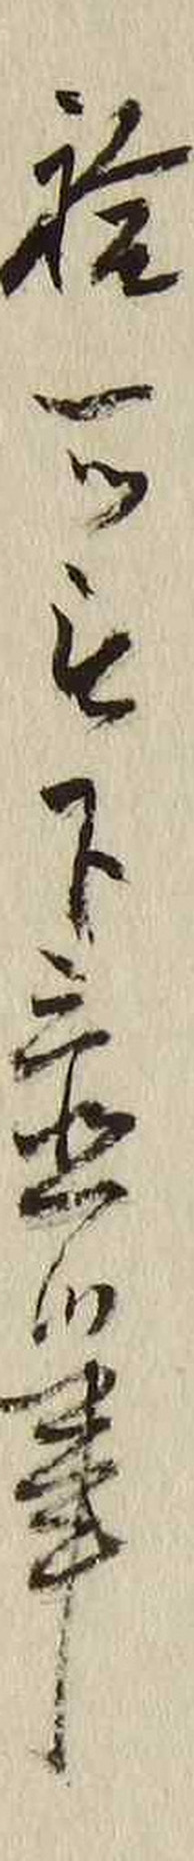袷一ツ被下置候事
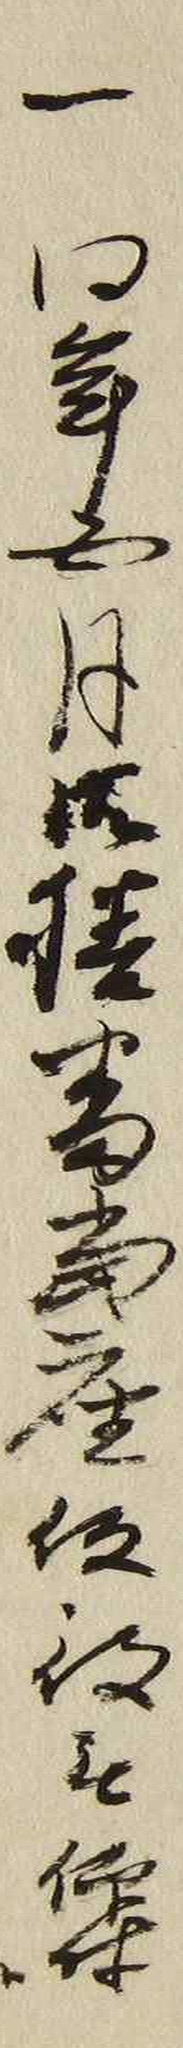一同年五月御膳番当座仮役被仰付候
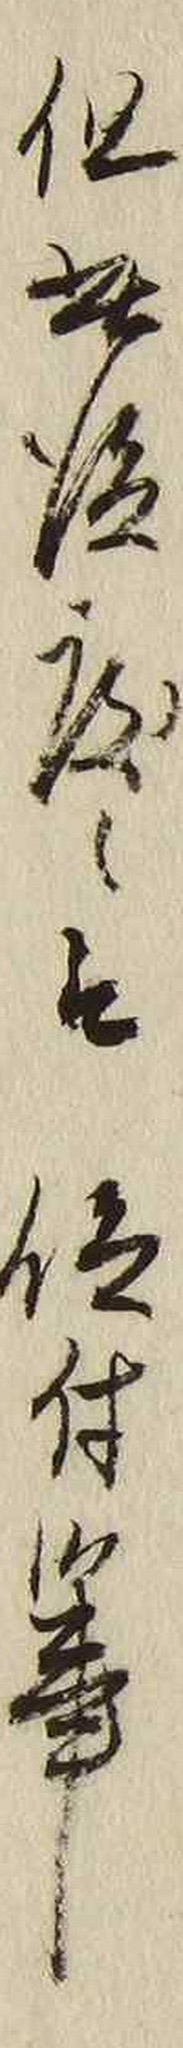但此後度々被仰付候事

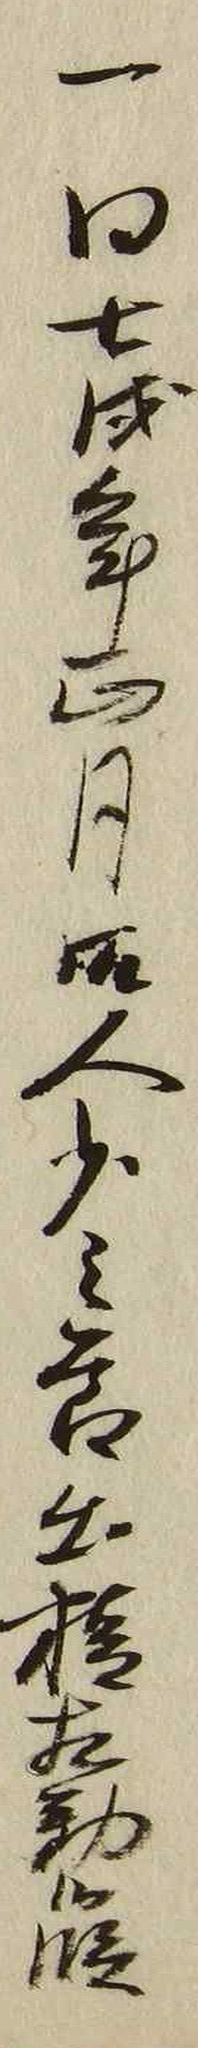一同七戌年正月御人少之節出精相勤候段
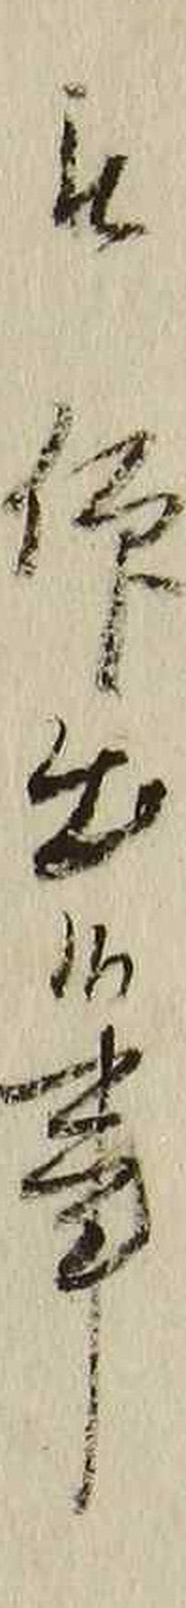被仰出候事
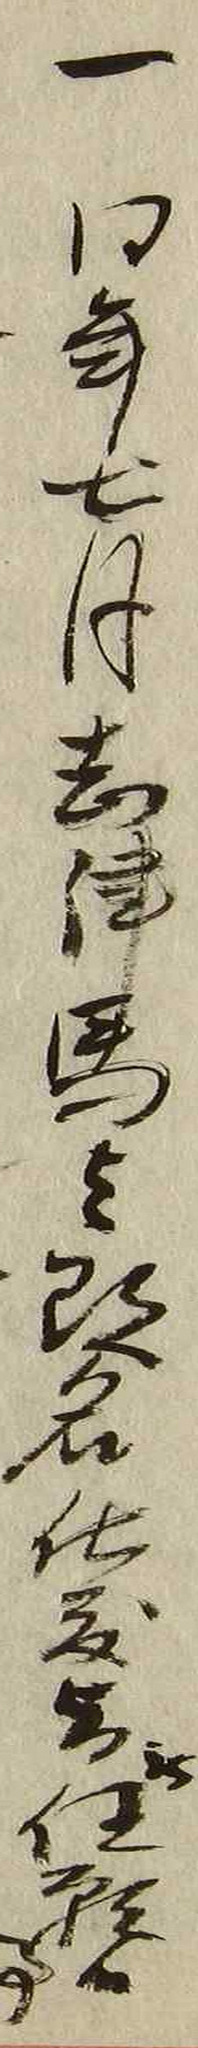一同年七月志津馬与改名仕度旨被任願候事
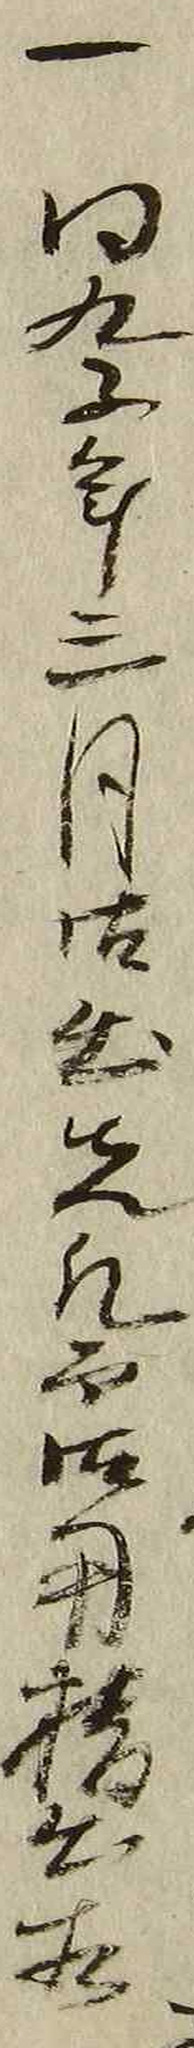一同九子年三月御出先凡而御用精出相
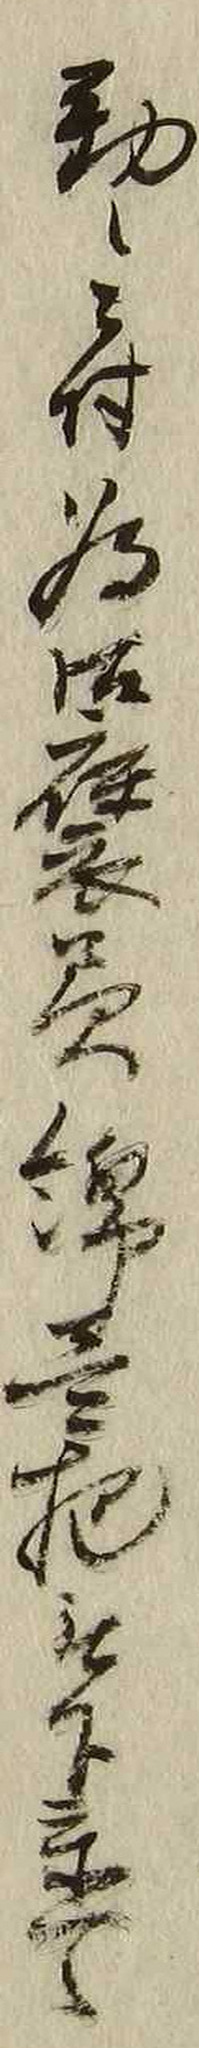勤候ニ付為御褒美綿壱把被下置候
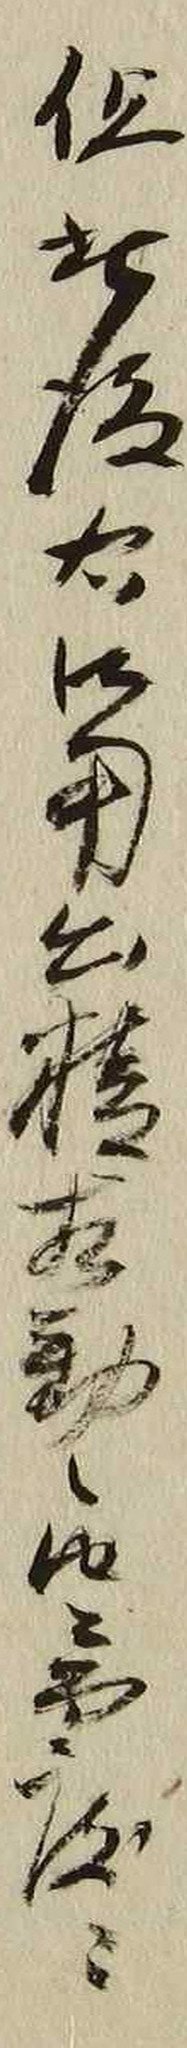但此後右御用出精相勤候由ニ而度々
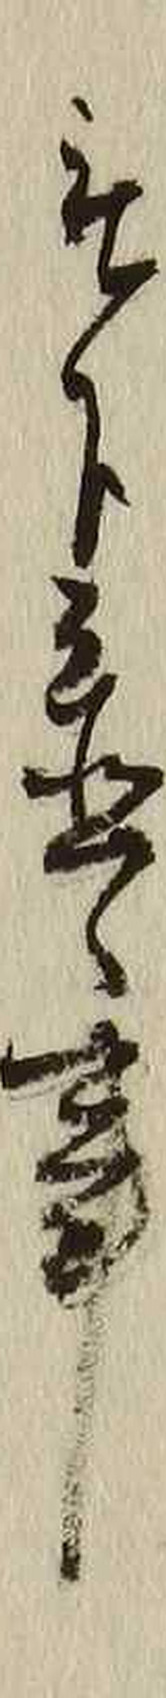被下置候事
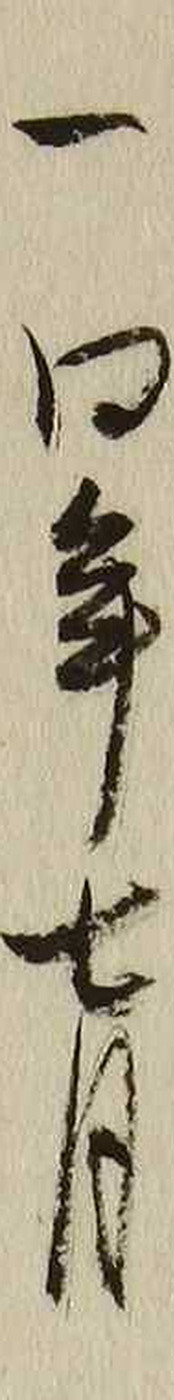一同年七月
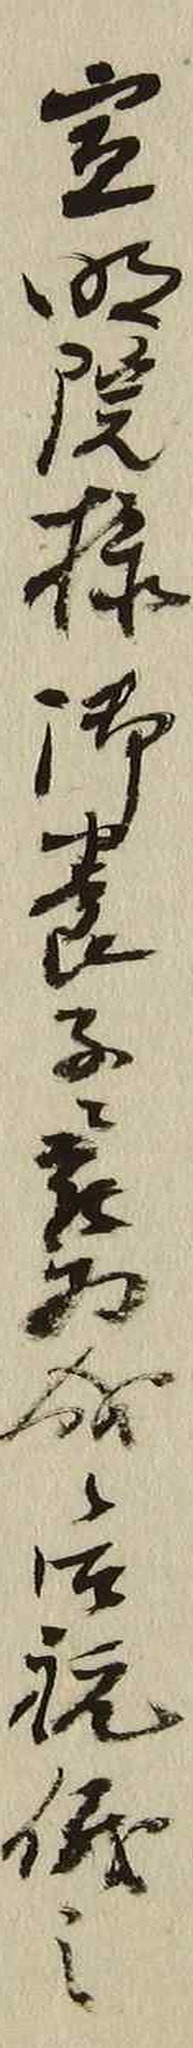宣明院様御養子ニ被為成候御祝儀之
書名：諸士系譜　巻之345　も之部1
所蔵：会津若松市立会津図書館
